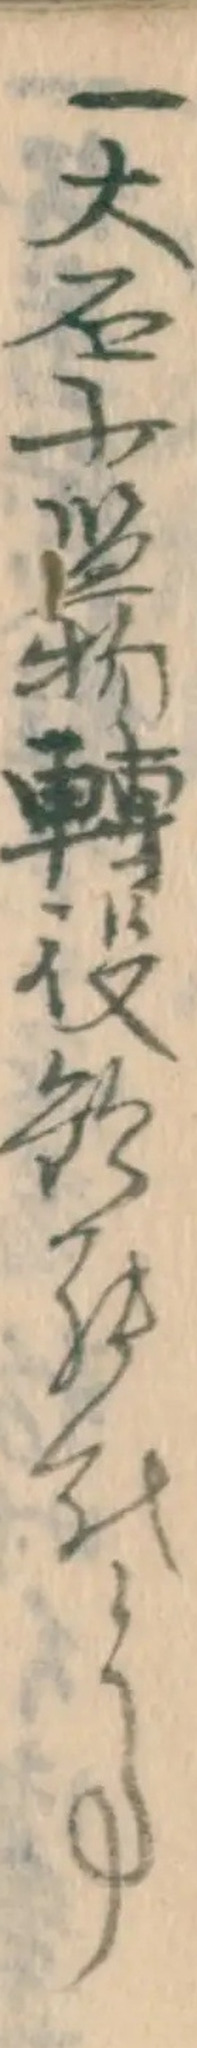一大石少監物転役歓罷越候事
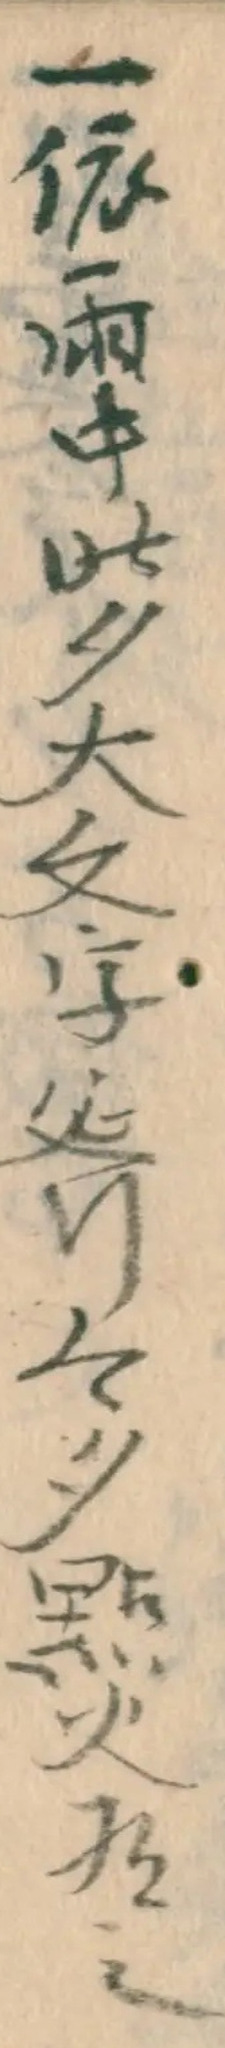一依雨中昨夕大文字延引今夕天火有之
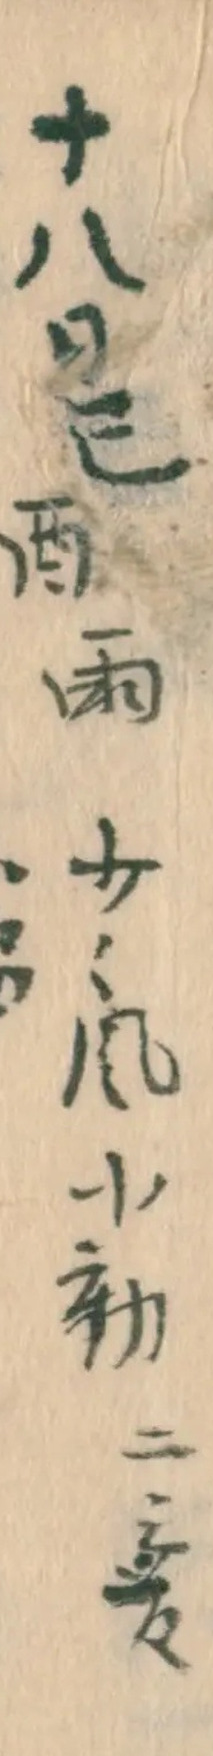十八日己酉雨少々風小動二三度
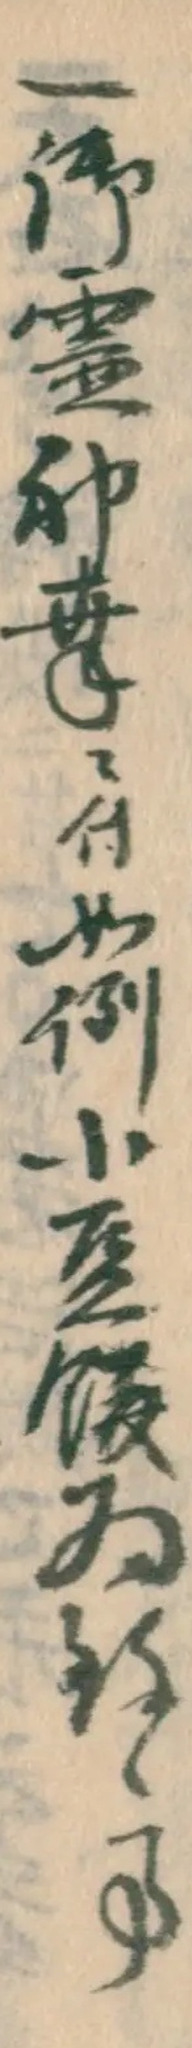一御霊神幸ニ付如例如例小豆飯為致候事
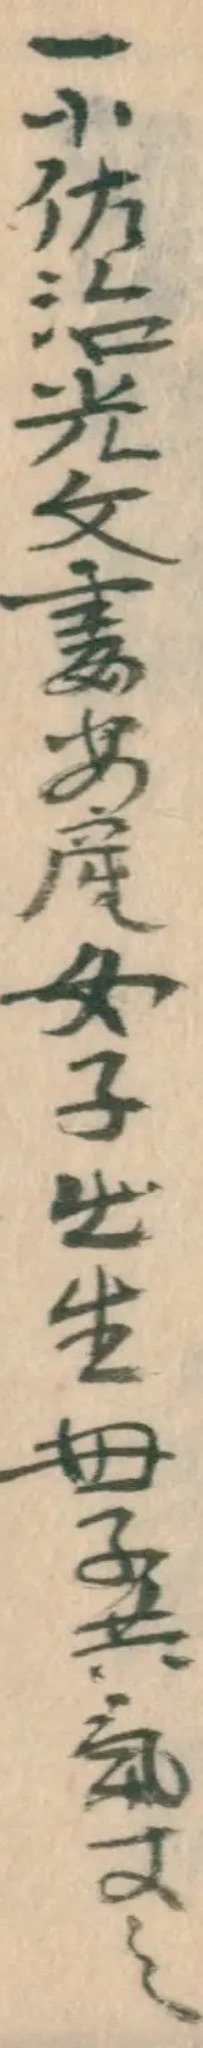一小佐治光文妻安産女子出生母子共気丈之
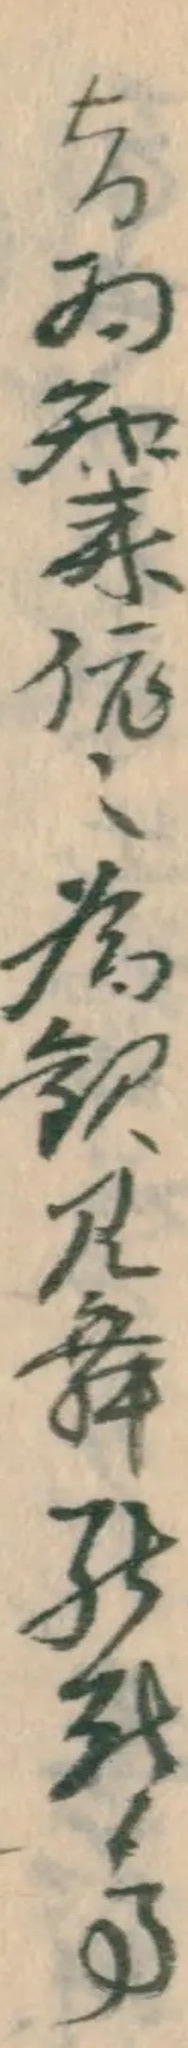旨為知来依之為歓見舞罷越候事
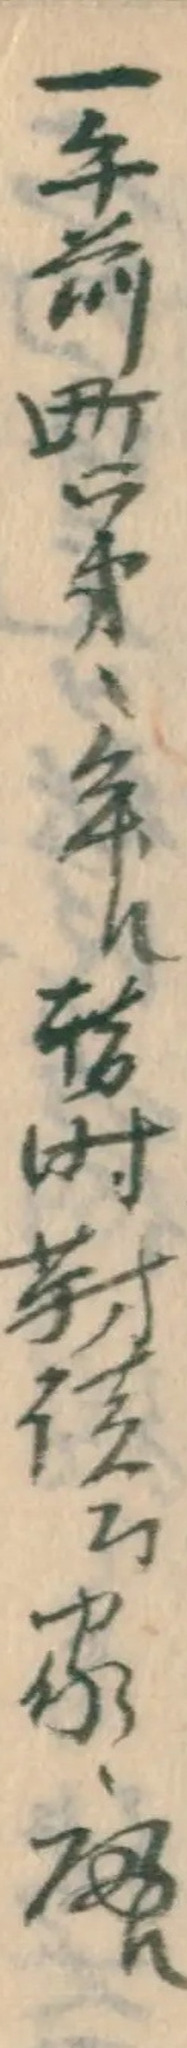一午前町口第へ参ル暫時対談而家へ帰ル
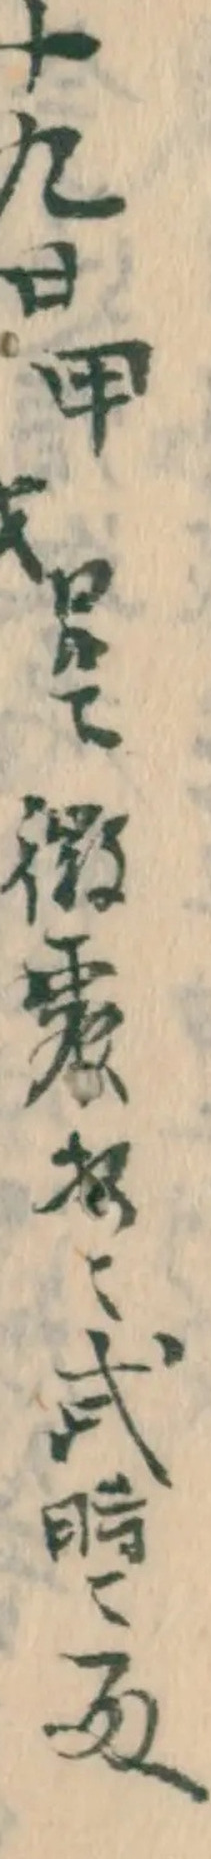十九日甲戌曇微震折々或時々雨
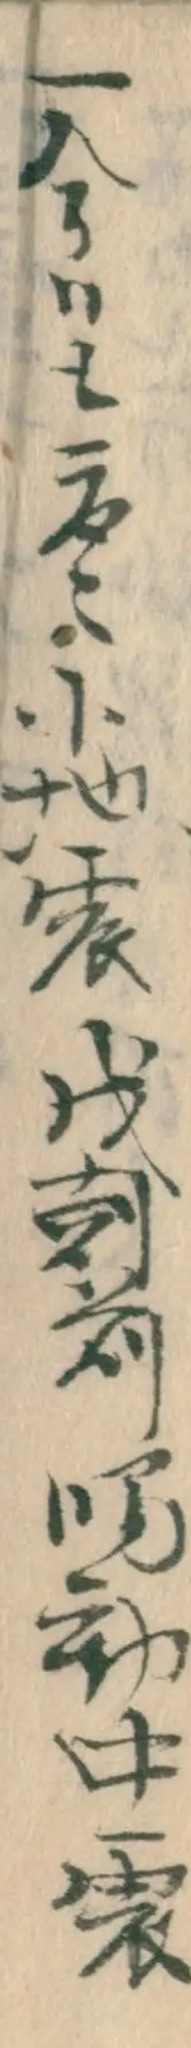一今日も度々小地震戌刻前鳴動中震
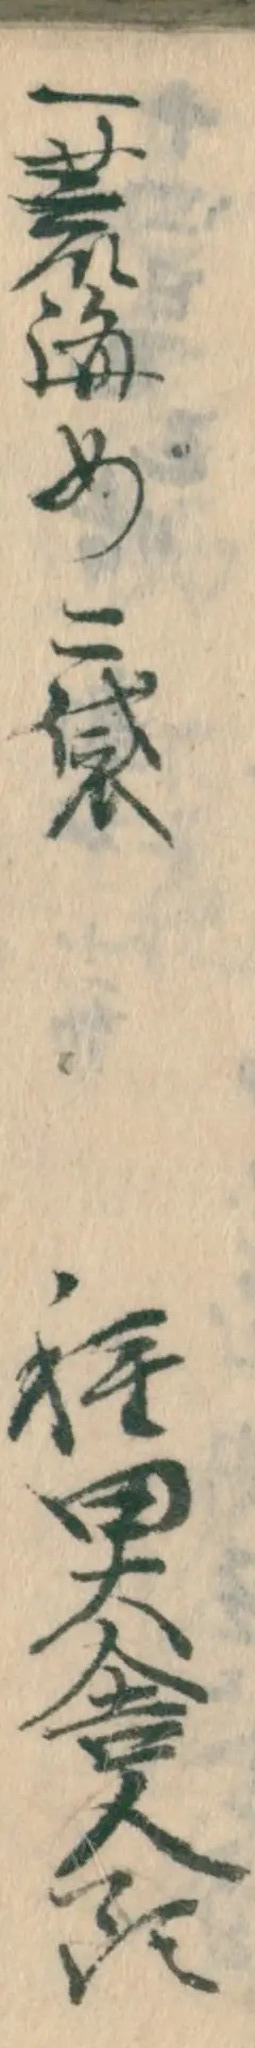一荒海め二袋種田大舎人頭
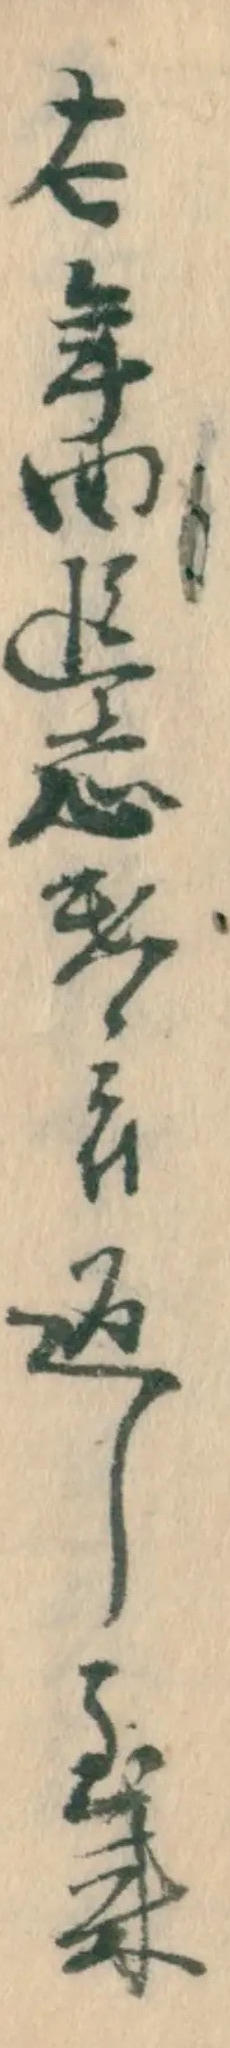右年回追志遣候ニ付返し到来

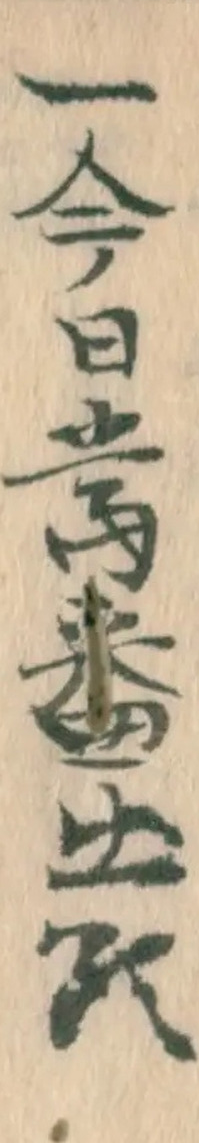一今日当番出頭
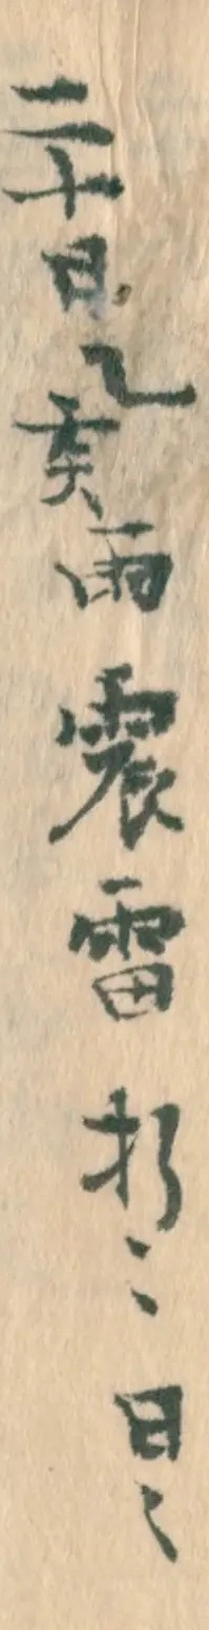二十日乙亥雨震雷折々日々
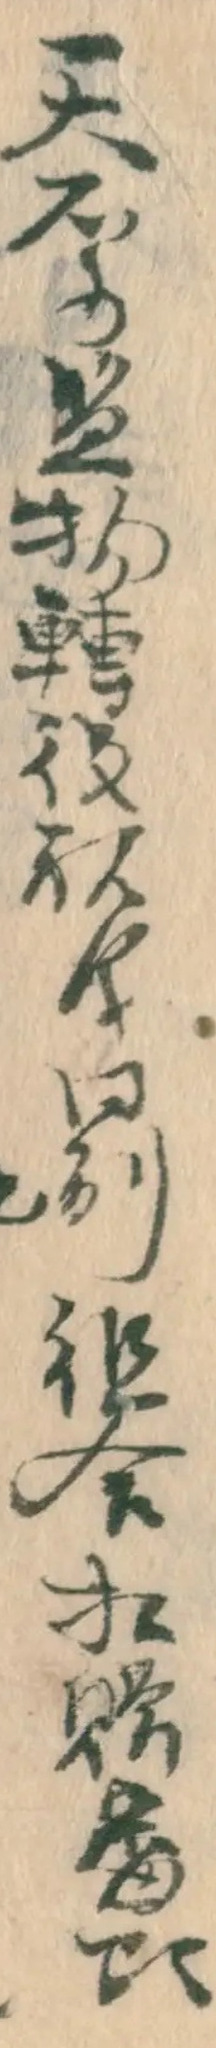一大石少監物転役祝義同列組合相贈番頭
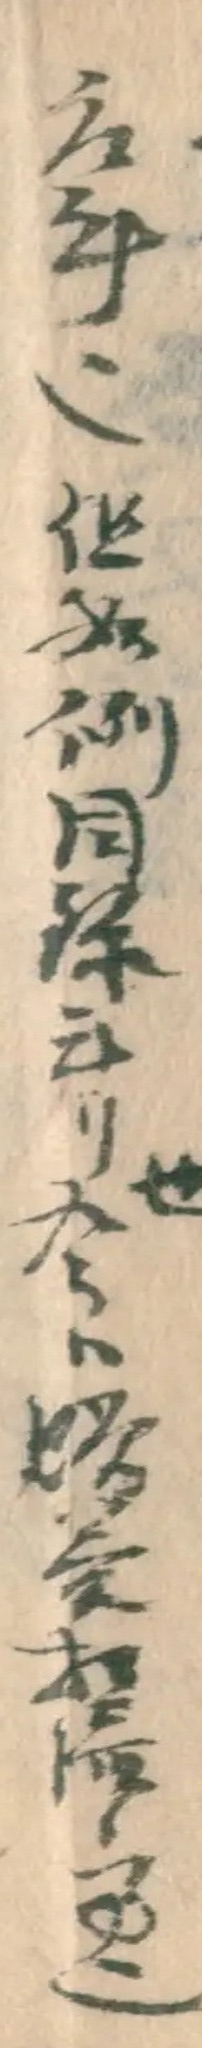取計也但如例目録計り也今日贈答相済候事也
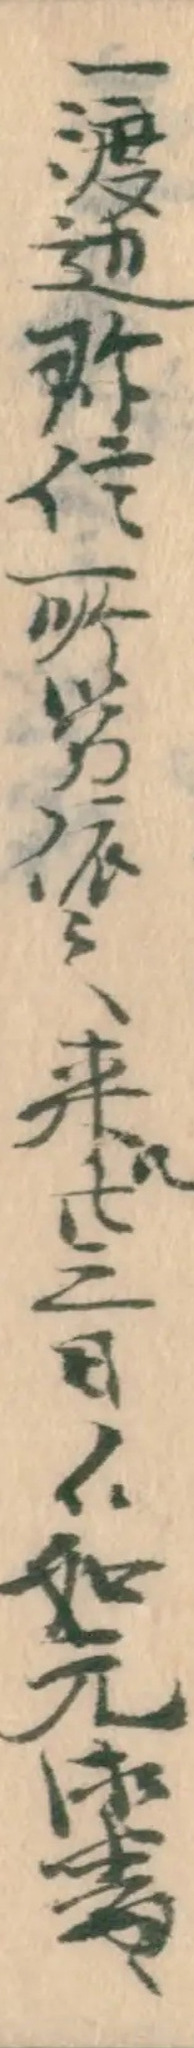一渡辺珍信所労依之来ル廿日ゟ如元御番へ
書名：禁裏御所御用日記. [131]
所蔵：国立国会図書館 National Diet Library, JAPAN
